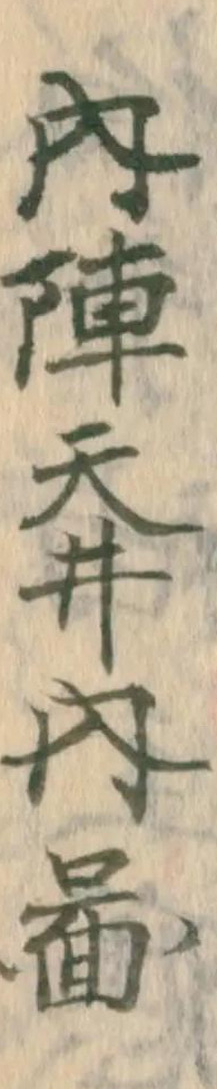内陣天井内図
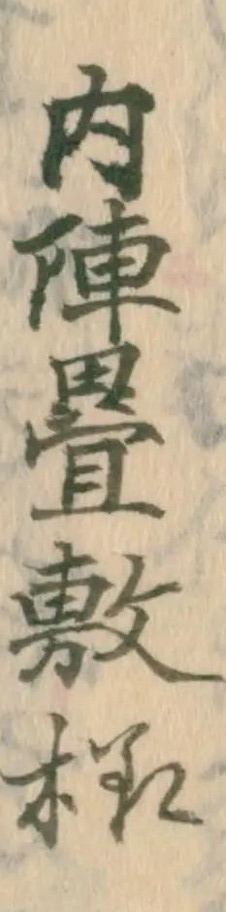内陣畳敷様
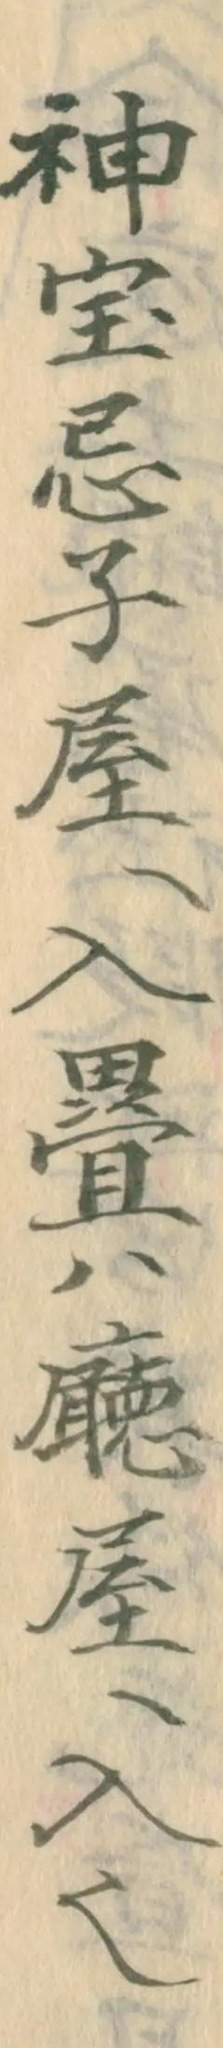神宝忌子屋へ入畳ハ庁屋ヘ入也

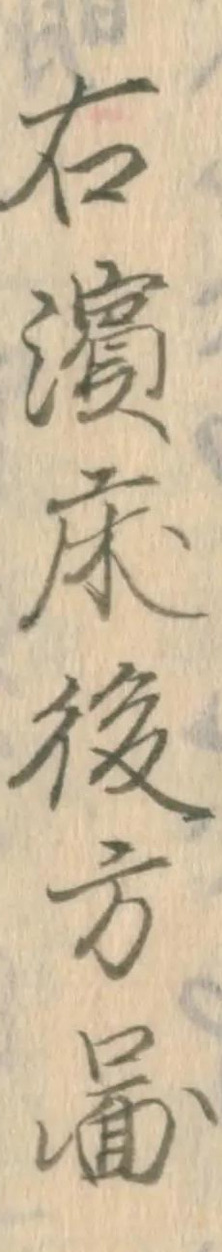右浜床後方図
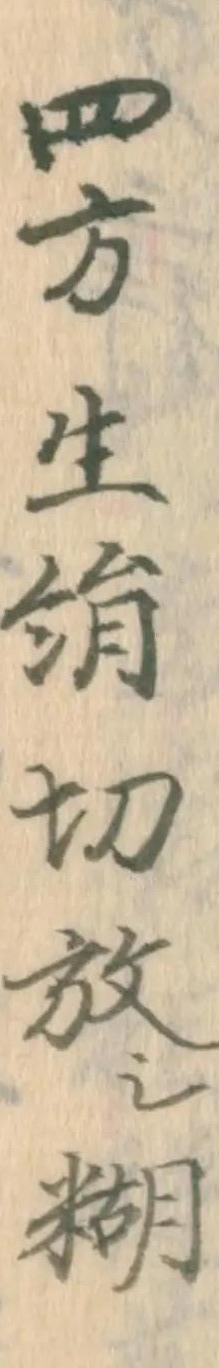四方生絹切放シ糊
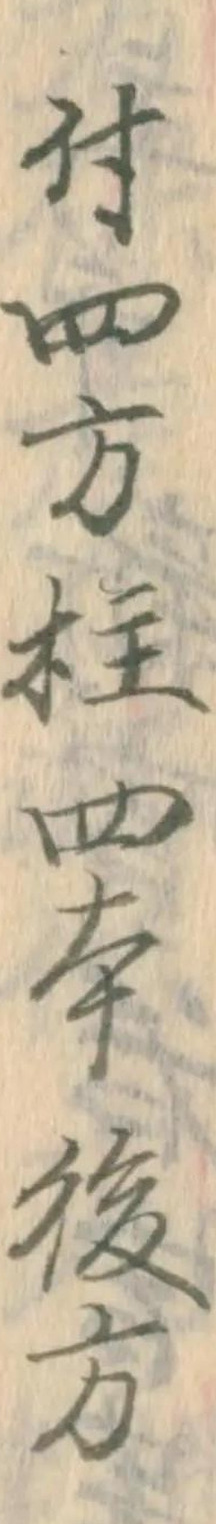付四方柱四本後方
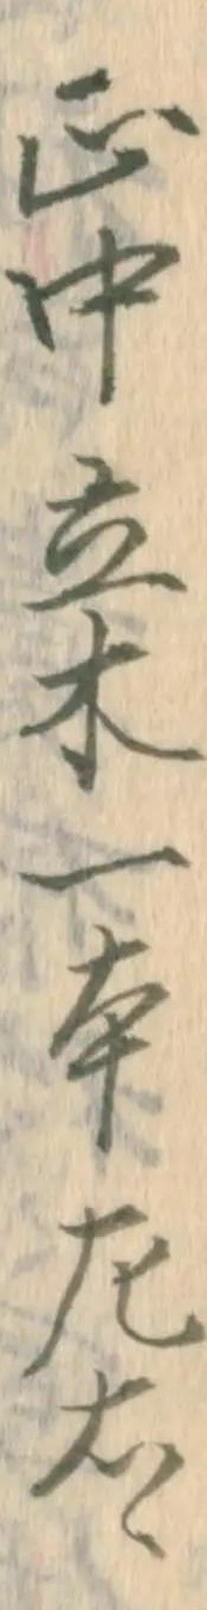正中立木一本左右へ
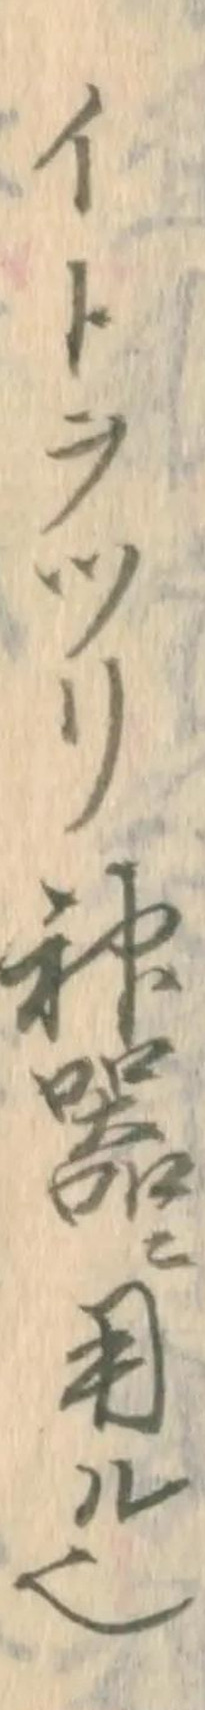イトヲツリ神器ニ用ル也

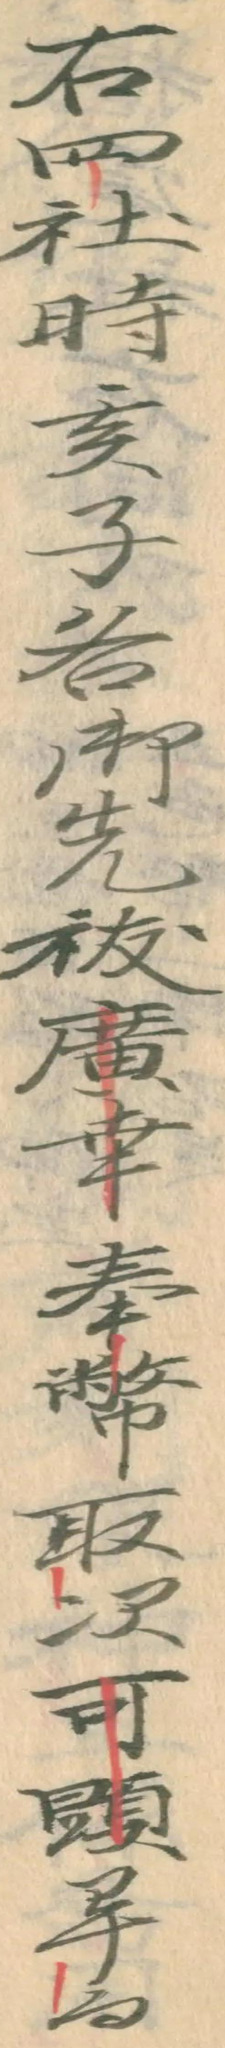右四-社時亥子各御先被廣幸奉-幣取_次可顕畢_而
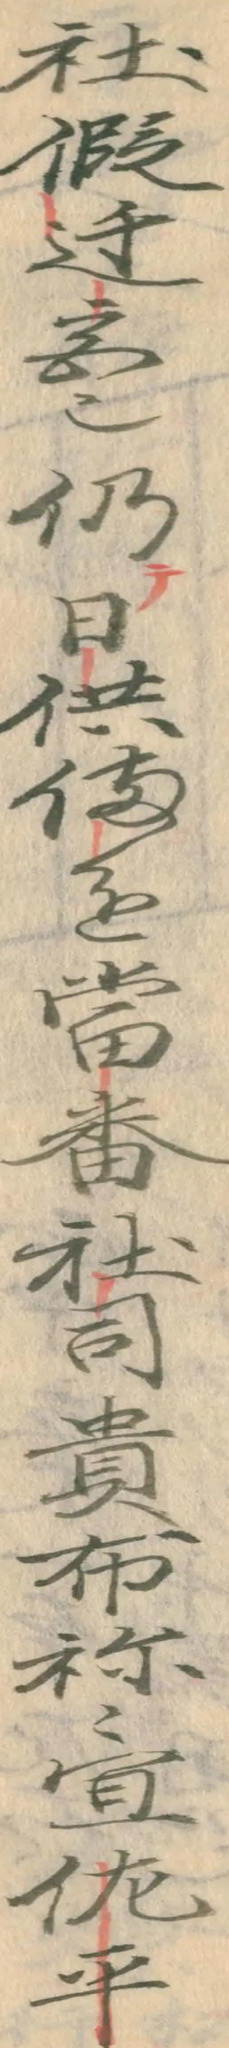社仮_迁-宮也仍日-供備-進当-番社-司貴布祢々宜佐平

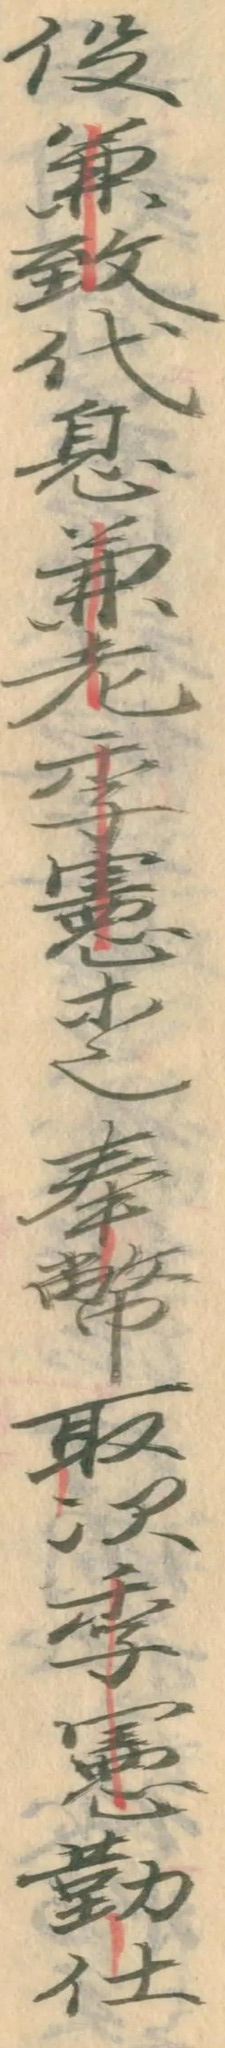役兼致代息兼老季憲等也奉-幣取_次季憲勤-仕
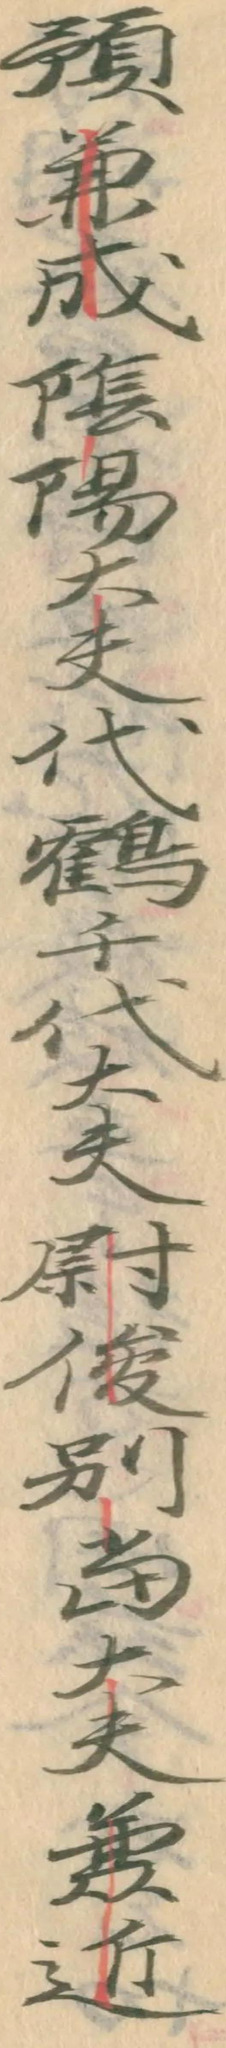預兼成陰-陽大-夫代鶴千代大夫尉俊別-当大-夫兼近
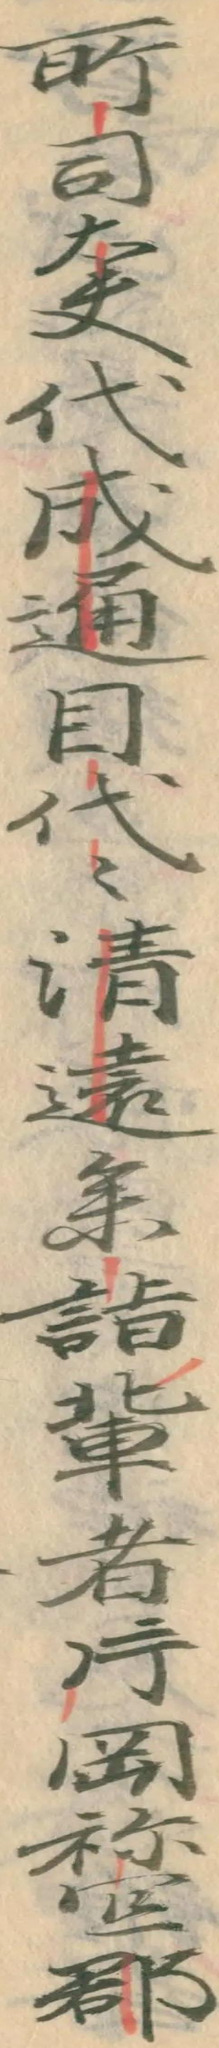所-司大-夫代成通目-代-々清遠参-詣輩者片_岡祢-宜郡
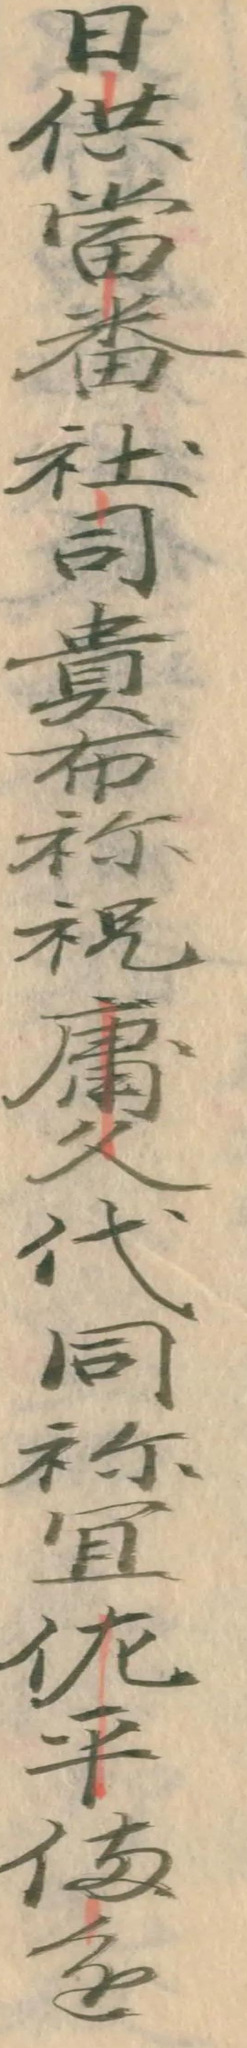日-供当-番社-司貴布祢祝庸久代同祢宜佐平備-進
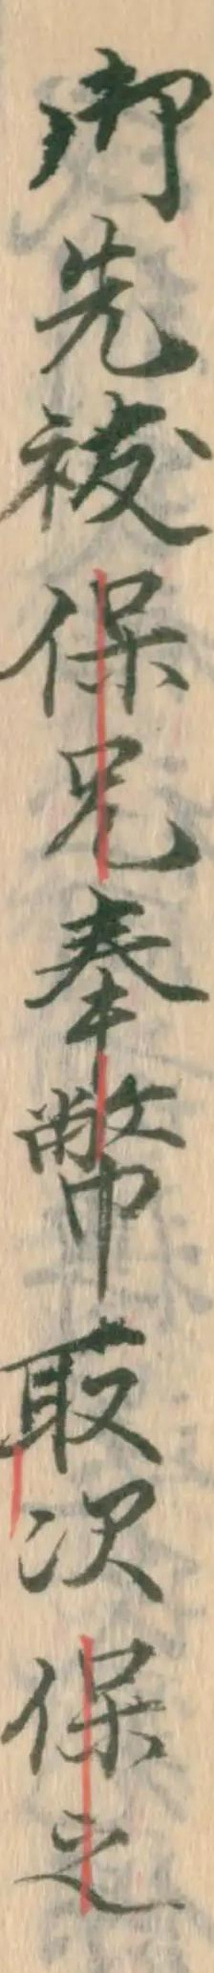御先祓保兄奉-幣取_次保之
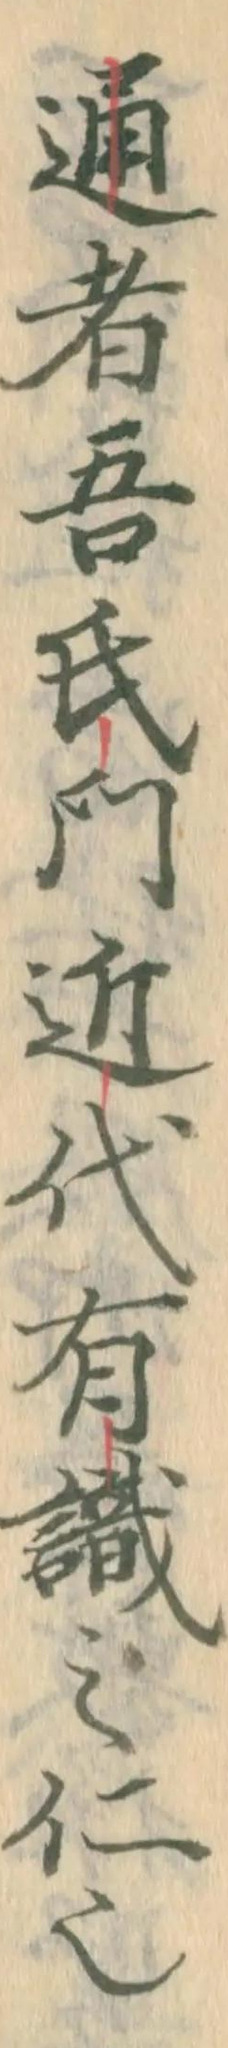通者吾氏-門近-代有-識之仁也
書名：賀茂社記録. 第16冊
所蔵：国立国会図書館 National Diet Library, JAPAN
